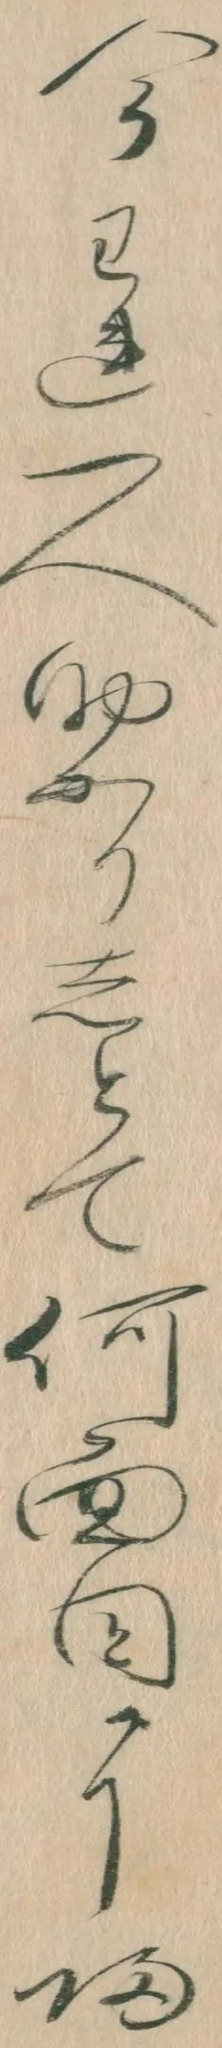今われ一人助かりしとて何面目に帰
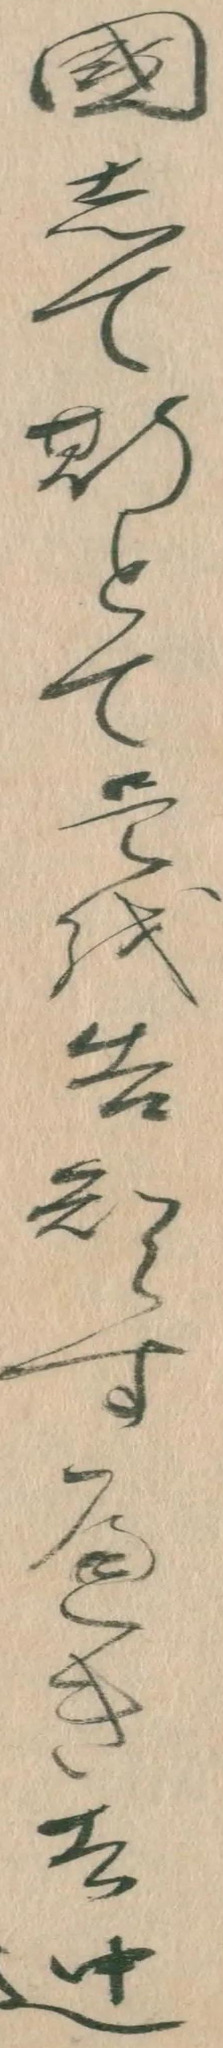国して斯とて是を告知らすへき去迚
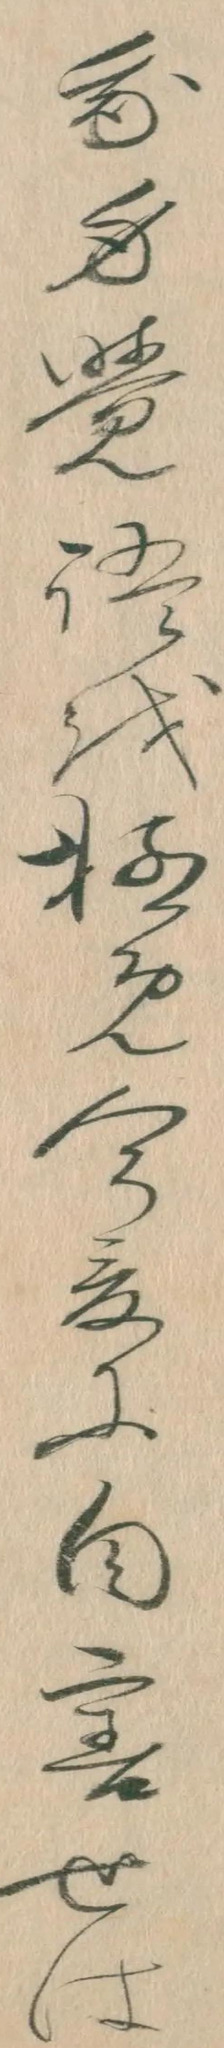我身覚語を極め今爰に自害せは
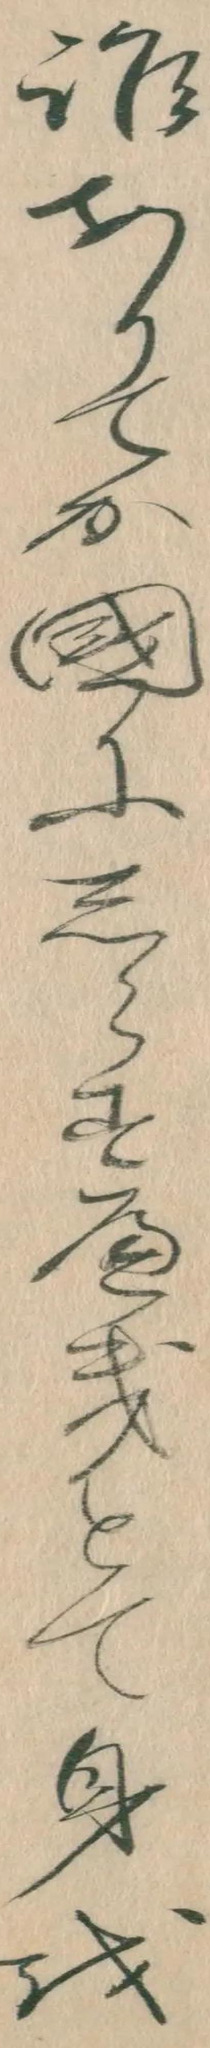誰ありてか国にしらすへきとて身を
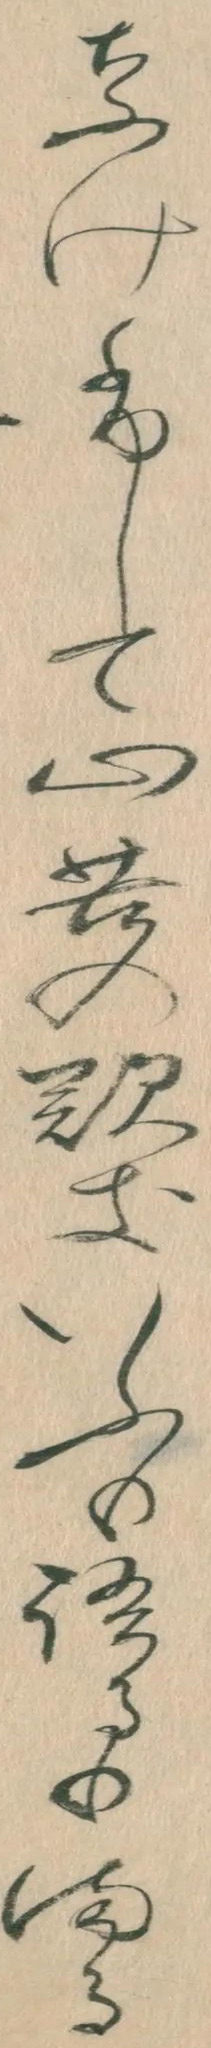なけふして心苦の歎きいふも語るもまる
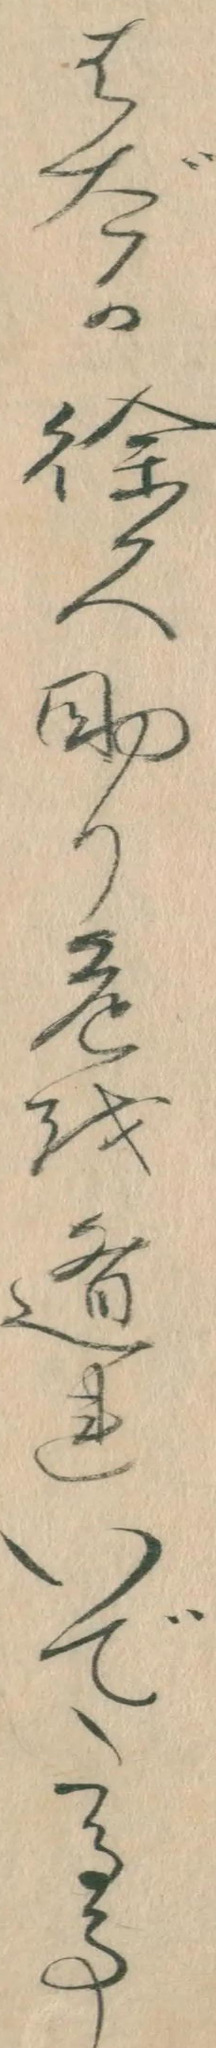はだか徐く助り危を遁れいでたる事

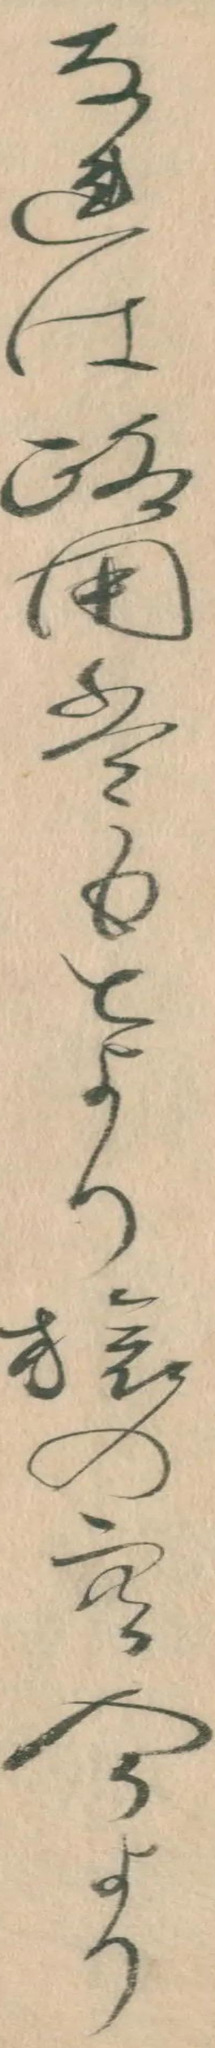なれは路用はもとより旅の空今より
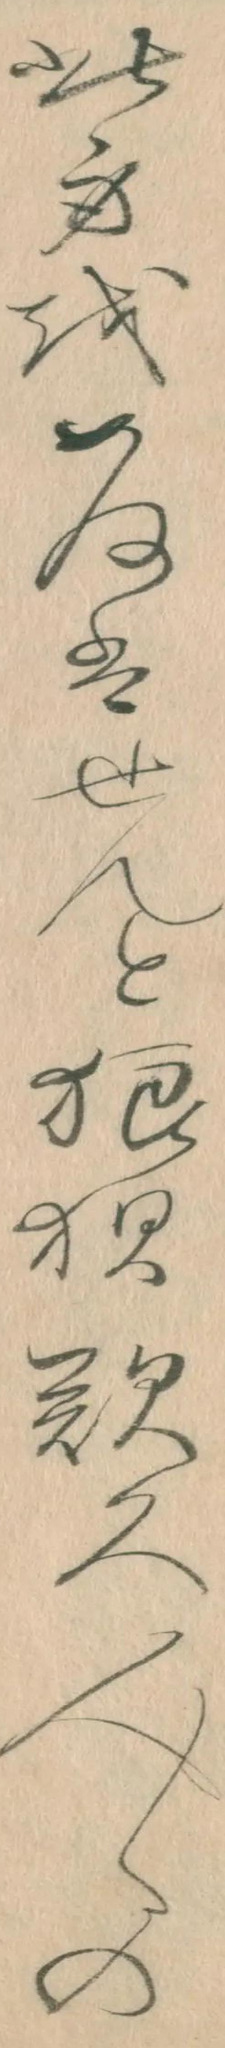此身を如何はせんと狼狽歎く人〳〵の
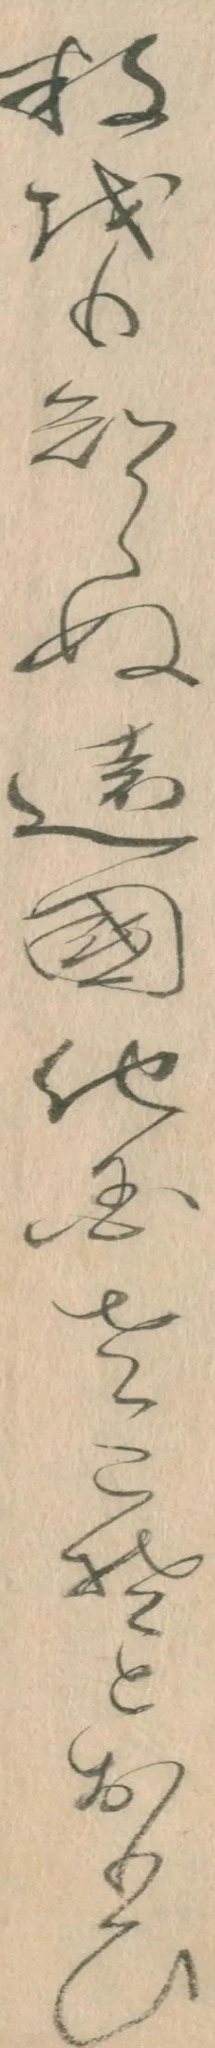数をも知らぬ遠国他国さこそとおもひ
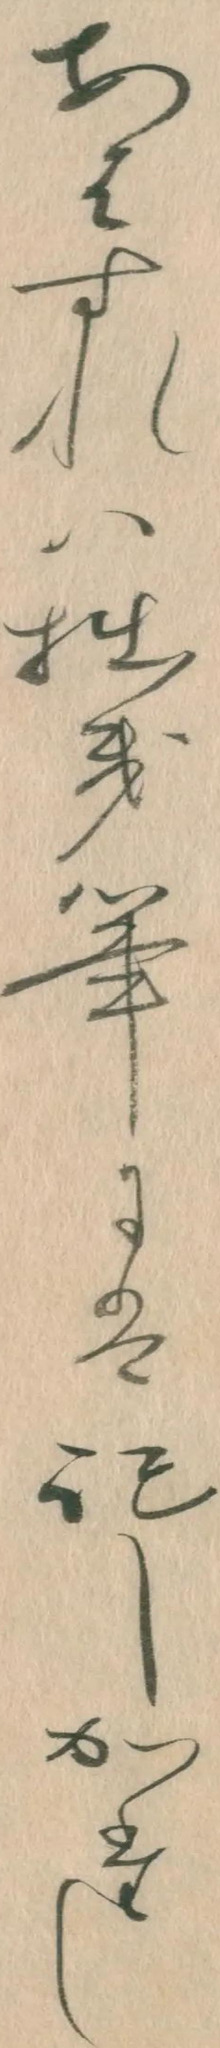あはすれは拙き筆には記しかたし
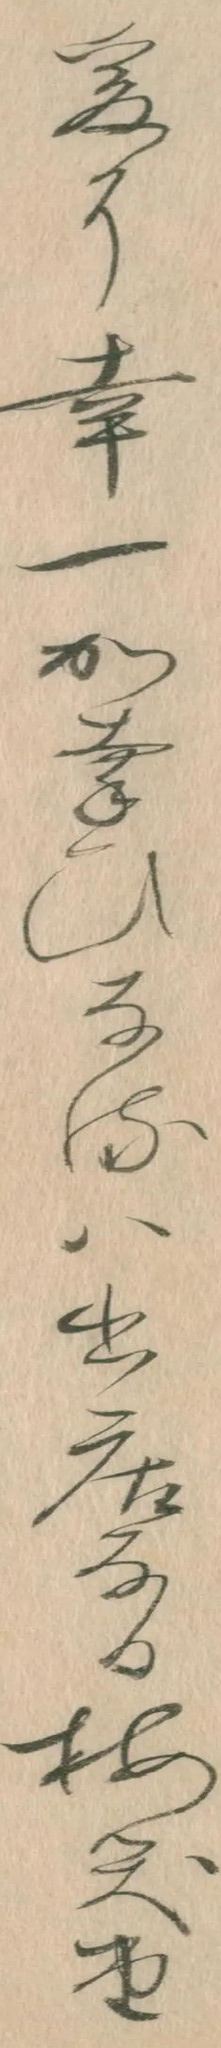爰に幸一か幸ひなるは出店なる梅笑堂
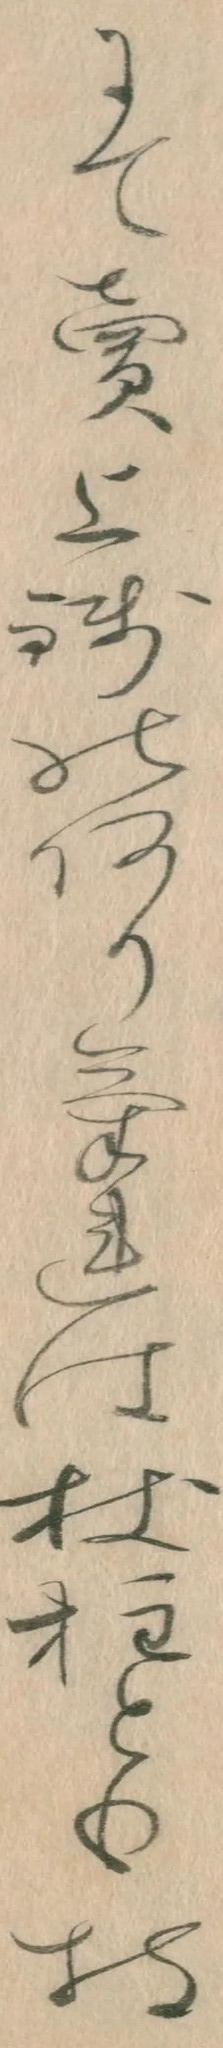にて売上銭のありけれは杖柱とも持
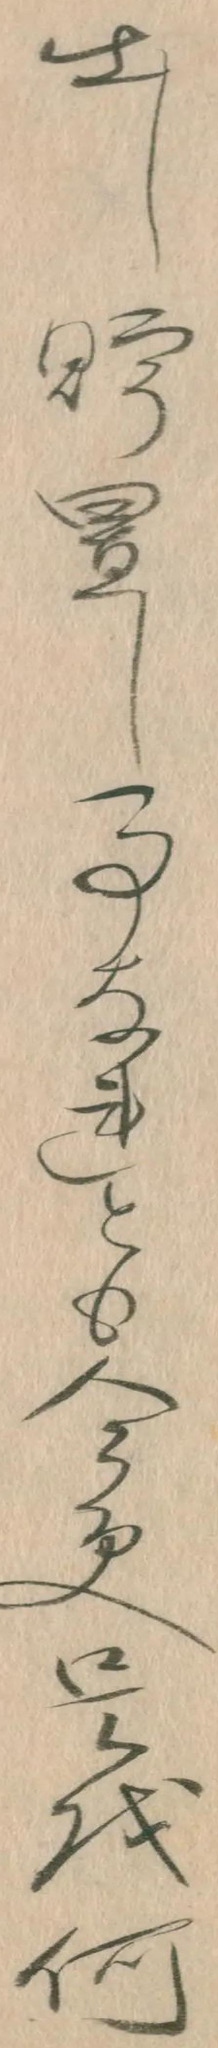出し貯置し事なれとも今更是を何
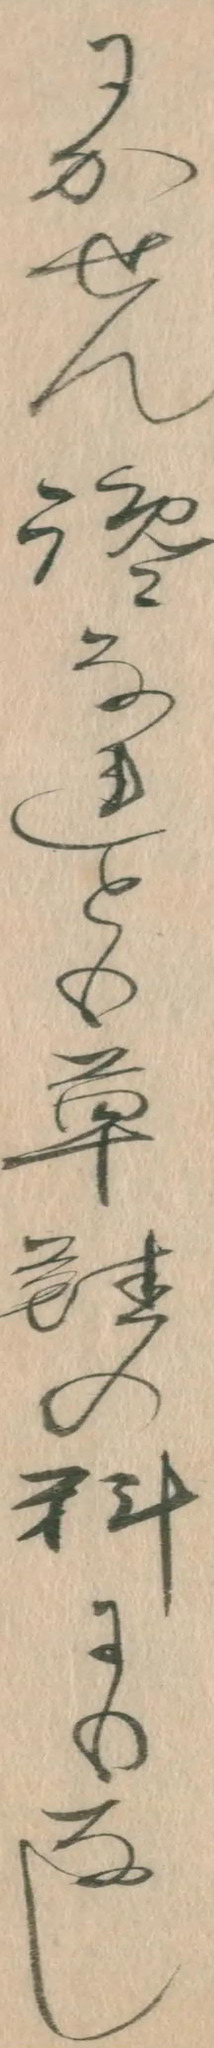にかせん纔なれとも草鞋の料にもなし
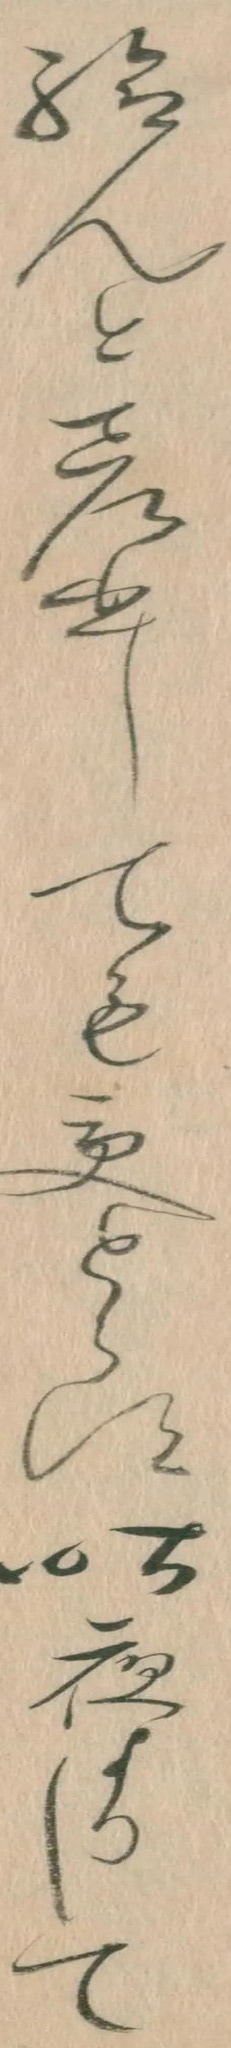給んと差出しても受とらす昨夜よりして
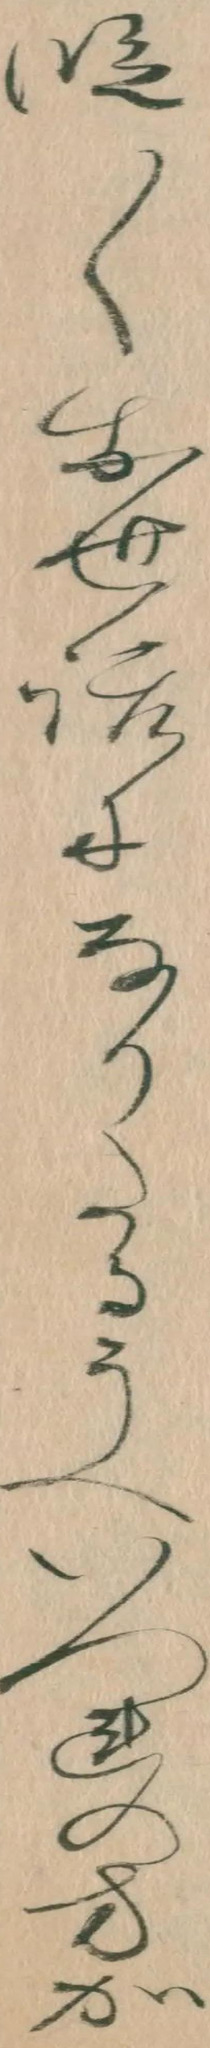段〳〵お世話になりたるうへいつれの方か
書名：俗語之種. [4]
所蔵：国立国会図書館 National Diet Library, JAPAN
